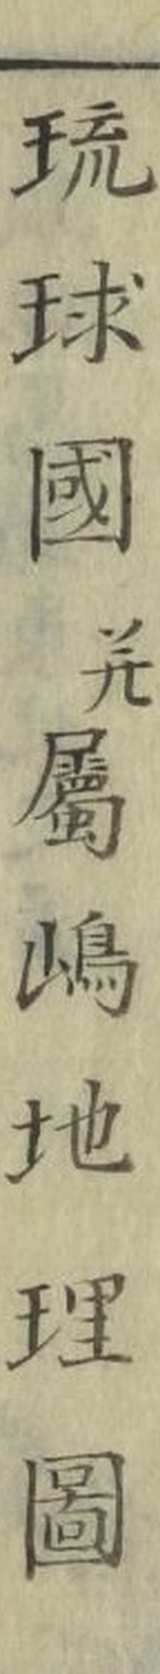琉球国并属嶋地理図

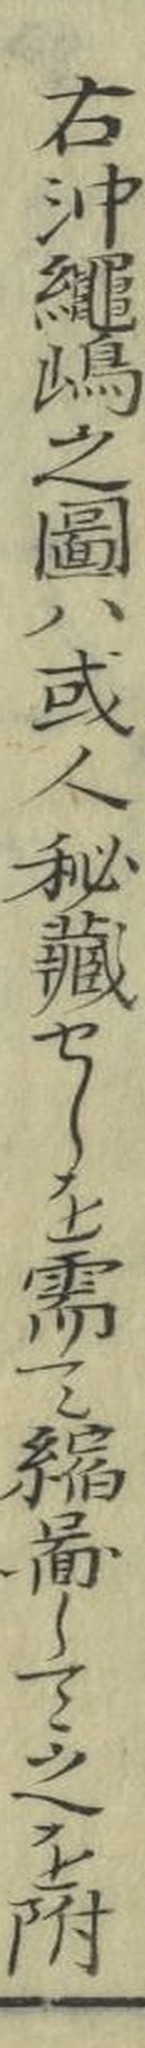右沖縄嶋之図は或人秘蔵せしを需て縮図して之を附
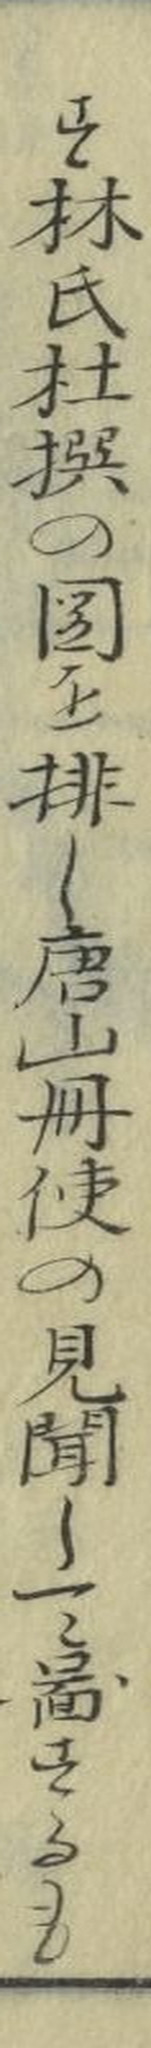す林氏杜撰の図を排し唐山冊使の見聞し一々図するも
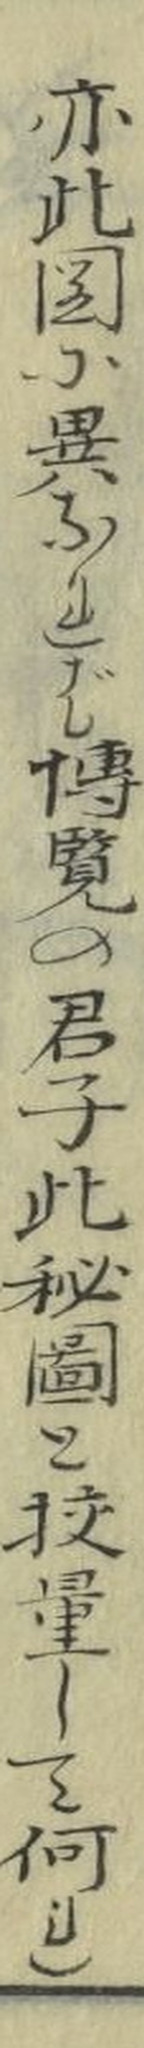亦此図に異なれば博覧の君子此秘図と挍量して何れ
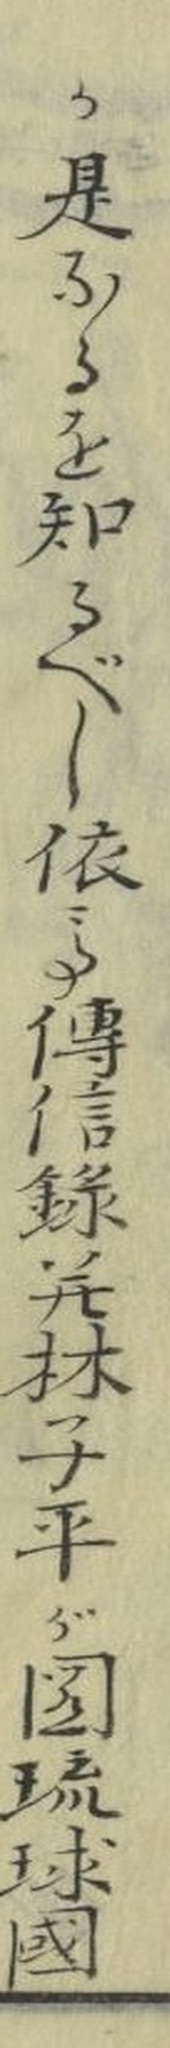か是なるを知るべし依て伝信録并林子平が図琉球国
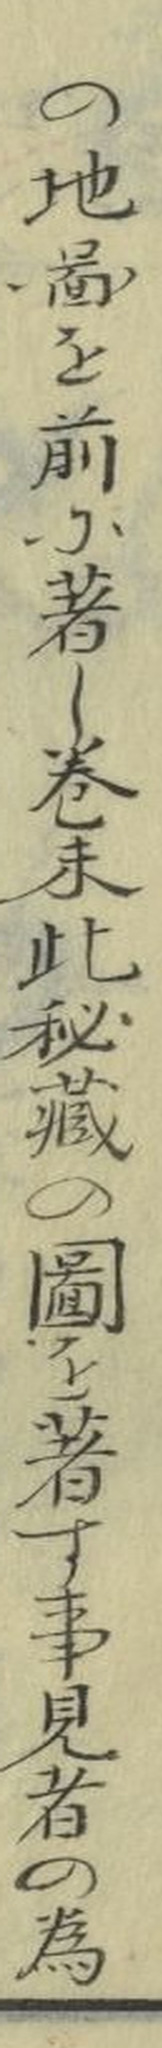の地図を前に著し巻末此秘蔵の図を著す事見者の為
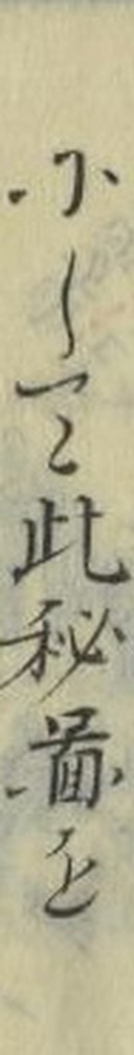にして此秘図を
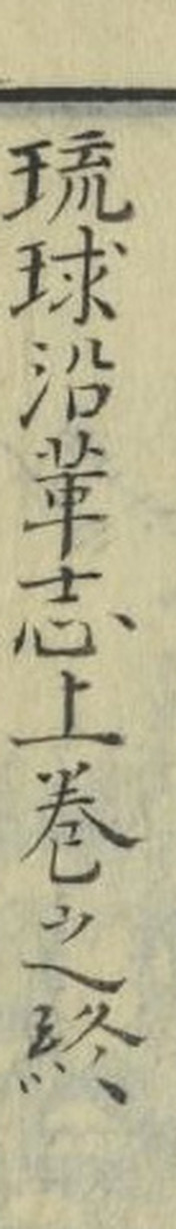琉球沿革志上巻之終
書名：琉球沿革志 上
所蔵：University of the Ryukyus Library
